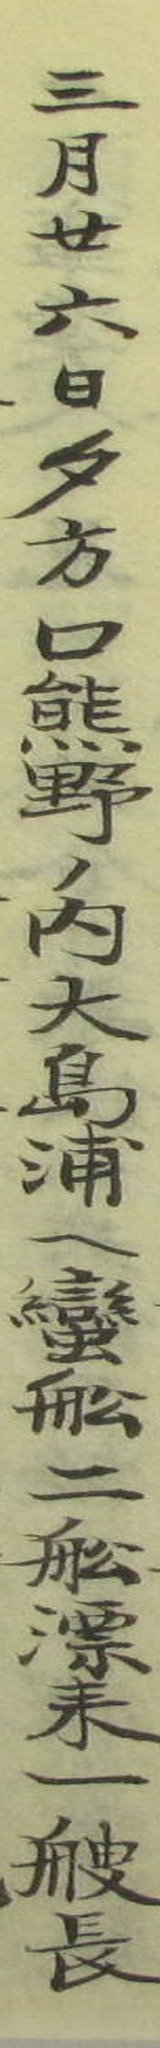三月廿六日夕方口熊野ノ内大島浦ヘ蠻舩二舩漂来一艘長
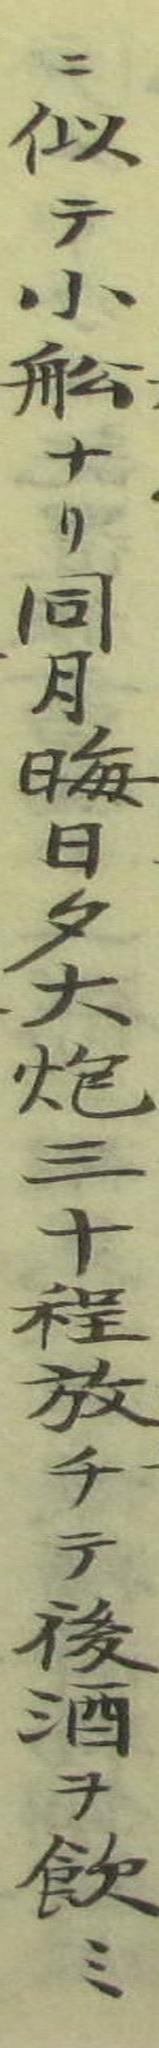ニ似テ小舩ナリ同月晦日夕大炮三十程放チテ後酒ヲ飲ミ
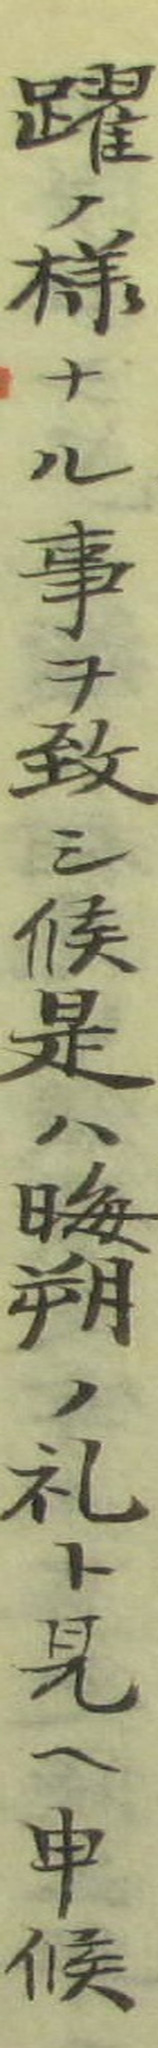躍ノ様ナル事ヲ致シ候是ハ晦朔ノ礼ト見ヘ申候
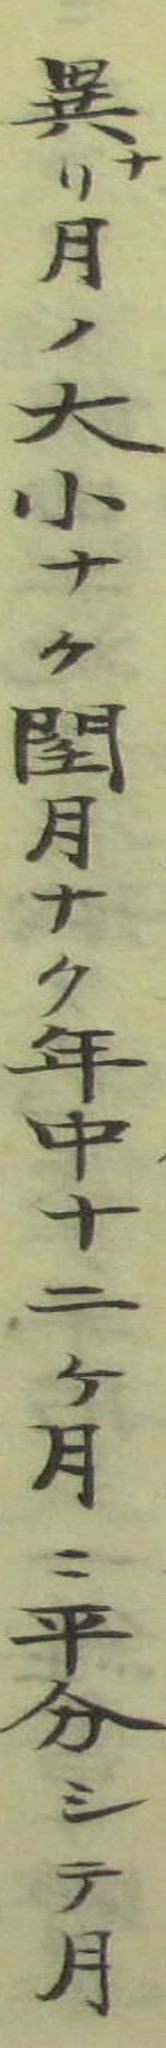異ナリ月ノ大小ナク閏月ナク年中十二ヶ月二平分シテ月
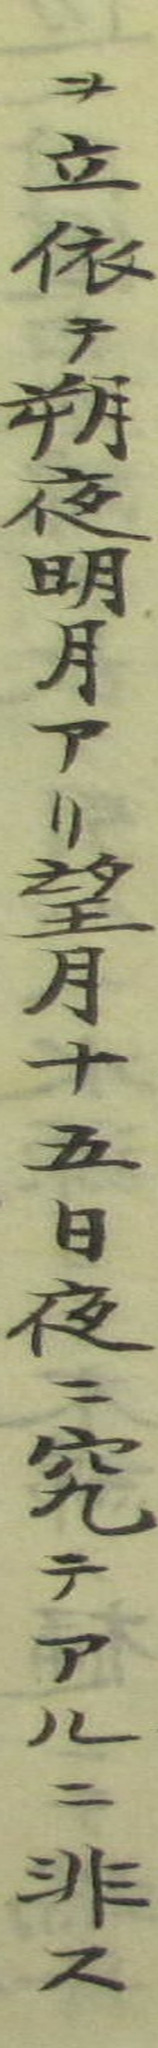ヲ立依テ朔夜明月アリ望月十五日夜ニ究テアルニ非ス
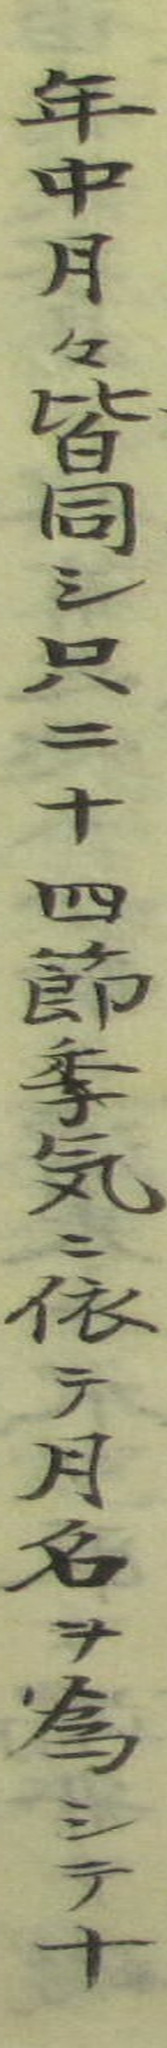年中月々皆同シ只二十四節季気ニ依テ月名ヲ為シテ十
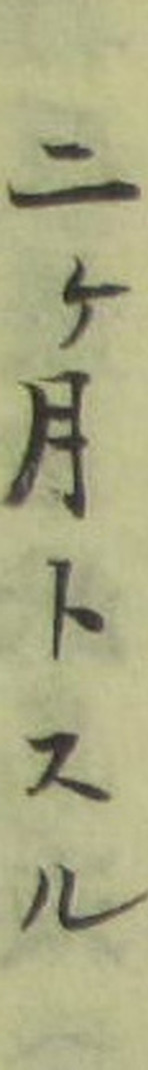二ヶ月トスル
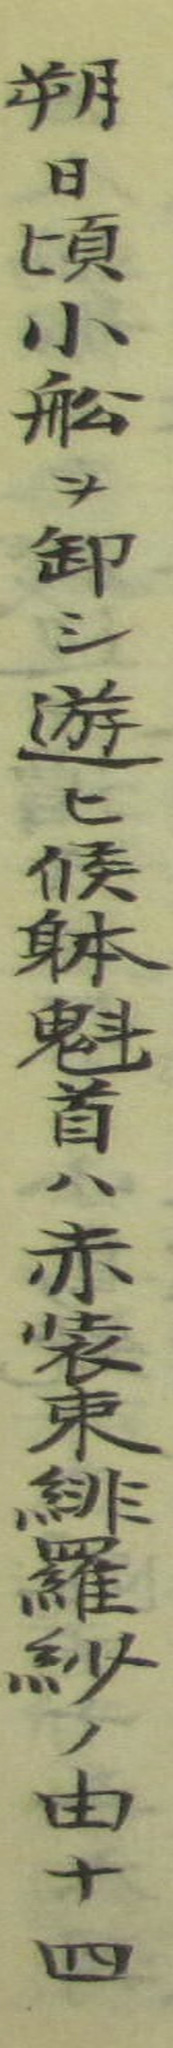朔日頃小舩ヲ卸シ遊ヒ候躰魁首ハ赤装束緋羅紗ノ由十四

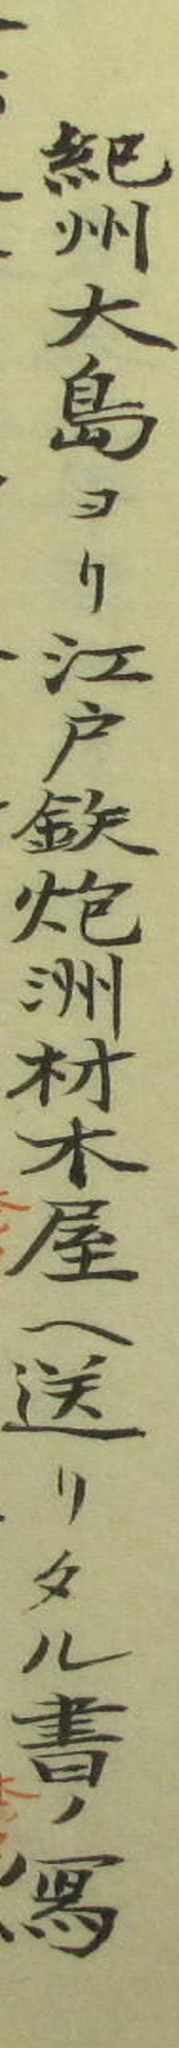紀州大島ヨリ江戸鉄炮洲材木屋ヘ送リタル書之寫
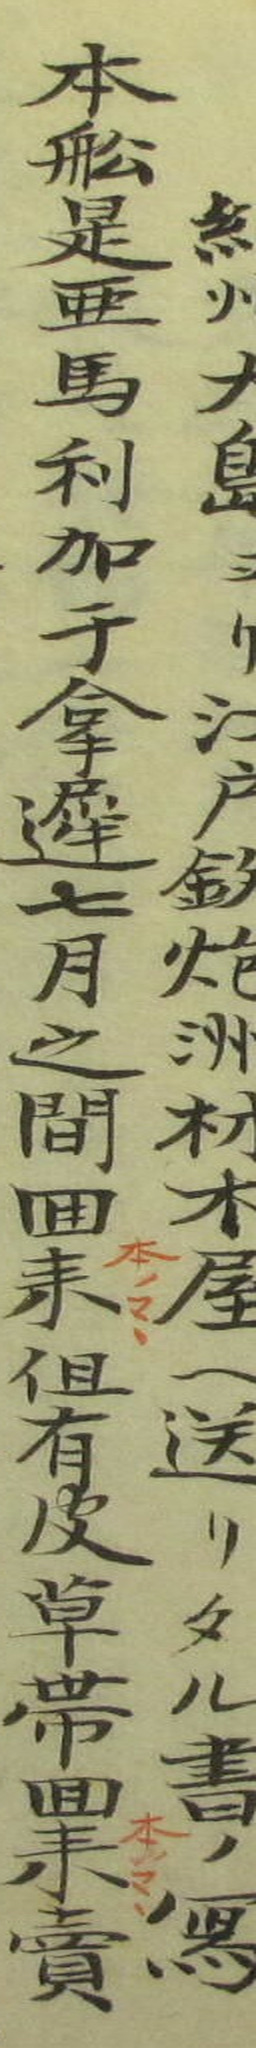本舩是亜馬利加干拿遲七月之間回来但有皮草帯回来賣
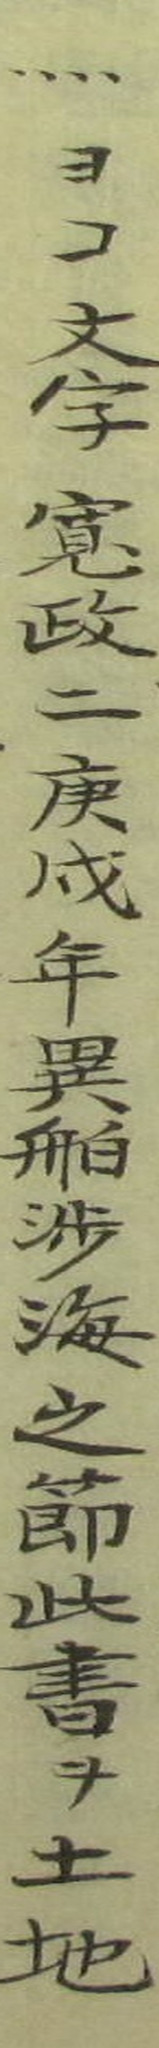ヨコ文字寛政庚戌年異舶渉海之節此書ヲ土地
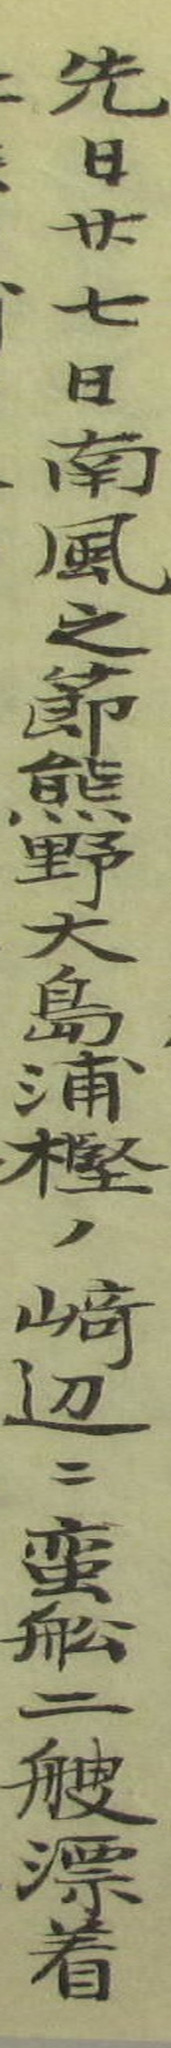先日廿七日南風之節熊野大島浦樫ノ﨑辺ニ蛮舩二艘漂着
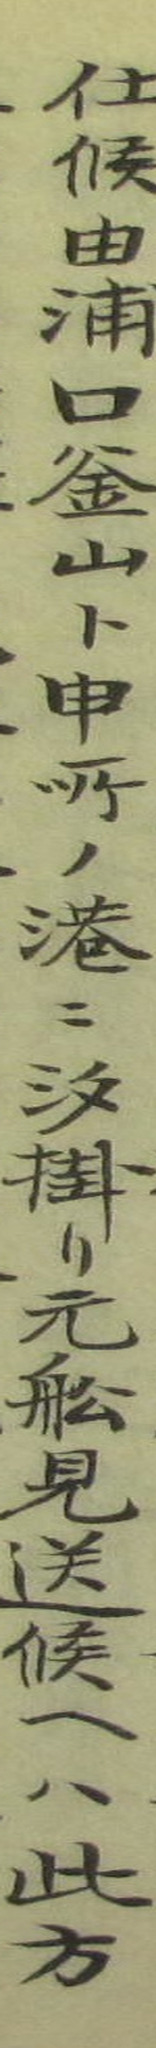仕候由浦口釜山ト申所ノ港ニ汐掛リ元舩見送候ヘハ此方
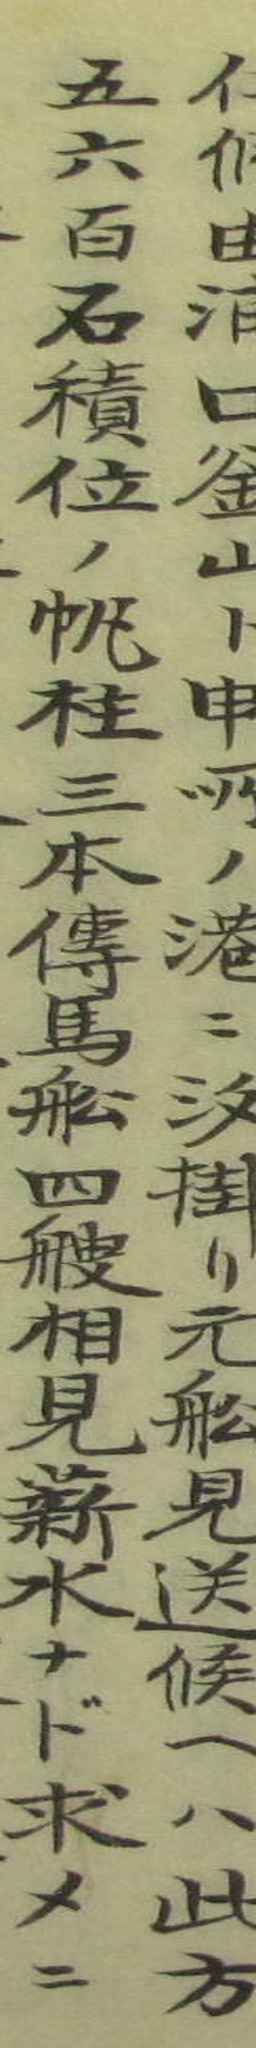五六百石積位ノ帆柱三本傳馬舩四艘相見薪水ナド求メニ
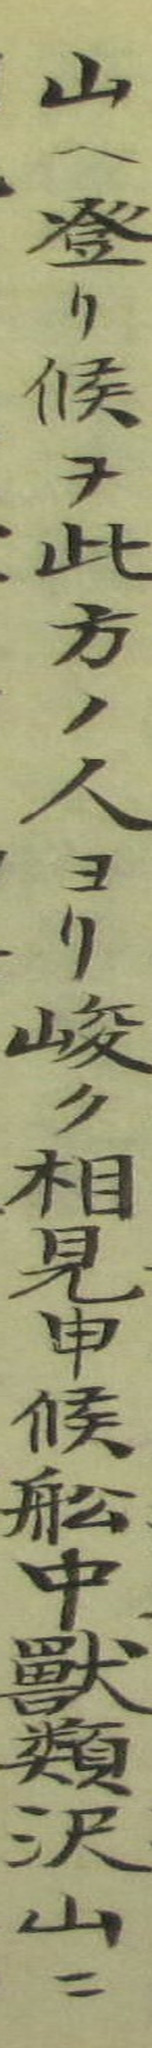山ヘ登リ候ヲ此方ノ人ヨリ峻ク相見申候舩中獣類沢山ニ
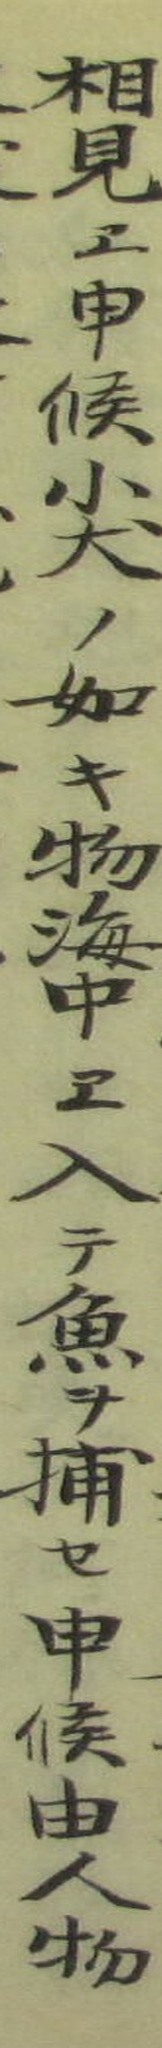相見ヱ申候子犬ノ如キ物海中ヱ入テ魚ヲ捕セ申候由人物
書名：異国船漂着記 外二
